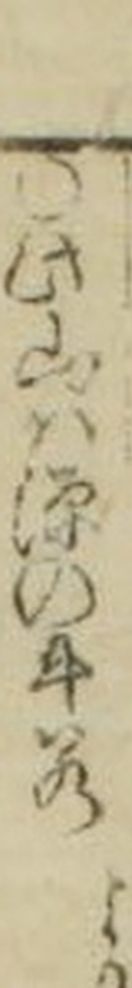◯此山は源の牛若
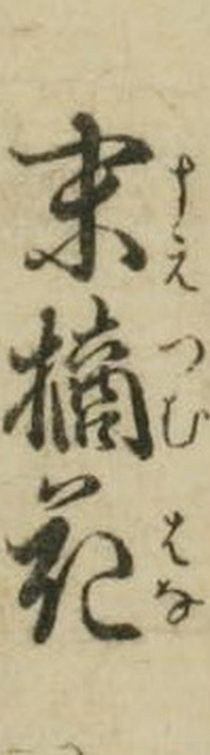末摘花
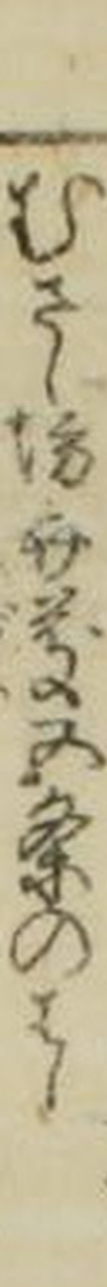むさし坊弁慶五条のはし
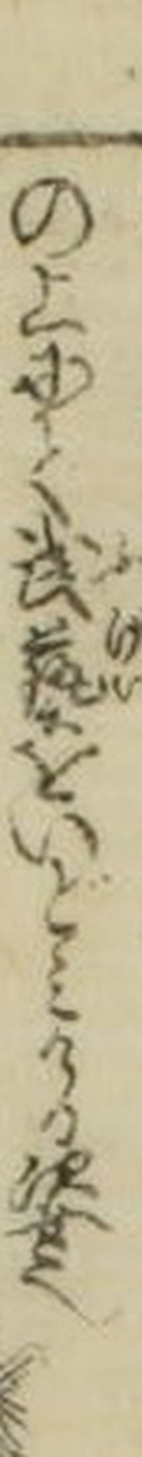の上にて武芸をいどみける姿也
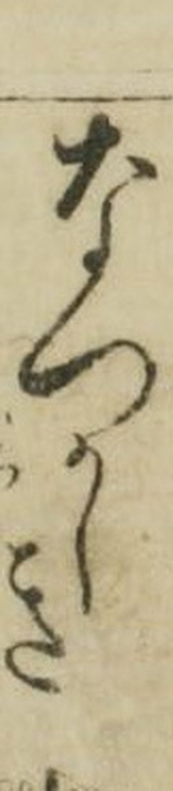なつかしき
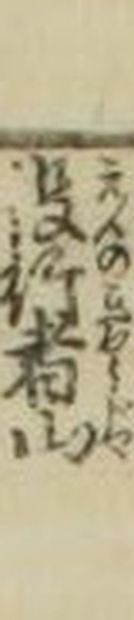役行者山
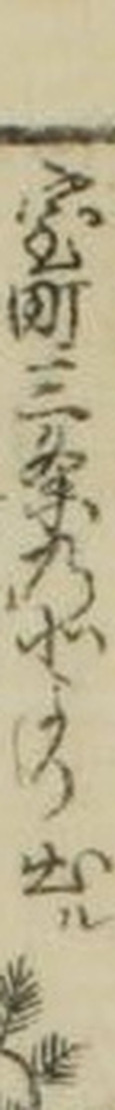室町三条の北より出
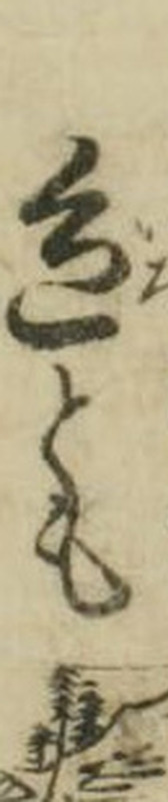色とも
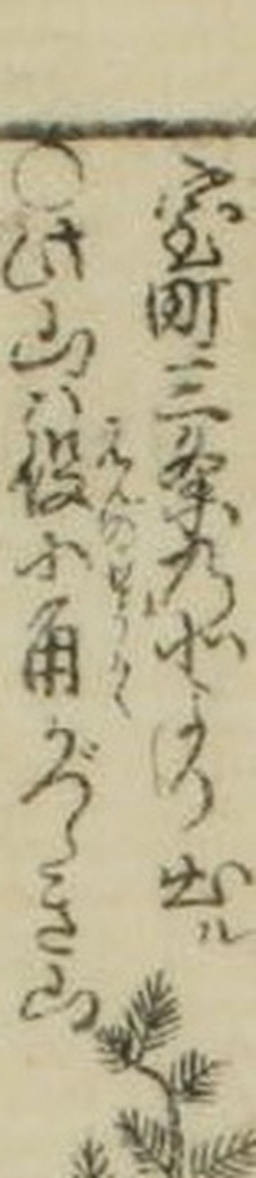◯此山は役小角かづらき山
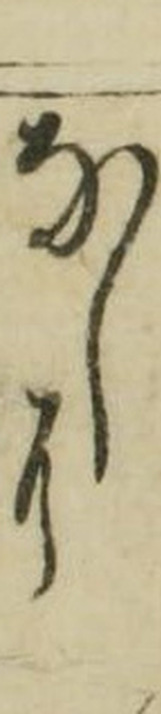なしに
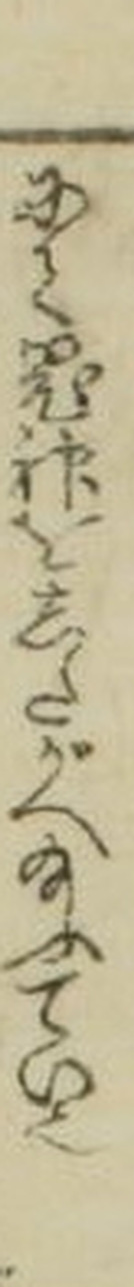にて鬼神をしたがへ給ふてい也
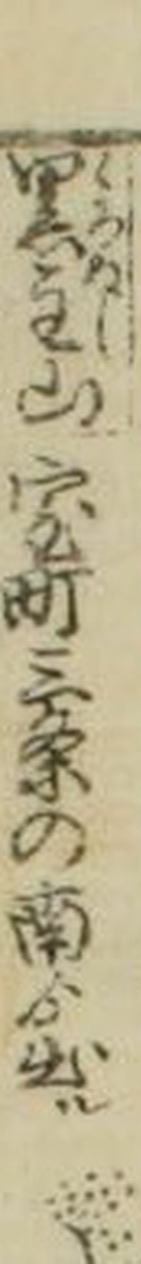黒主山室町三条の南より出
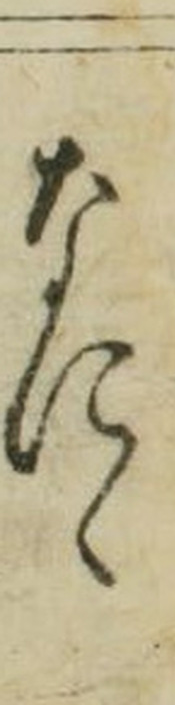なにゝ
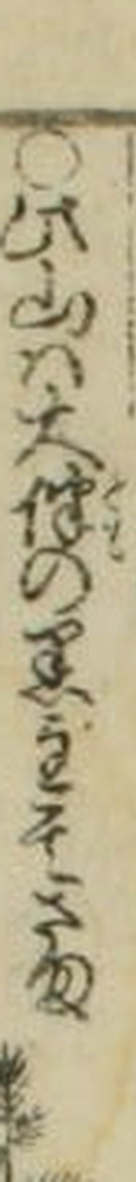◯此山は大伴の黒主其さま
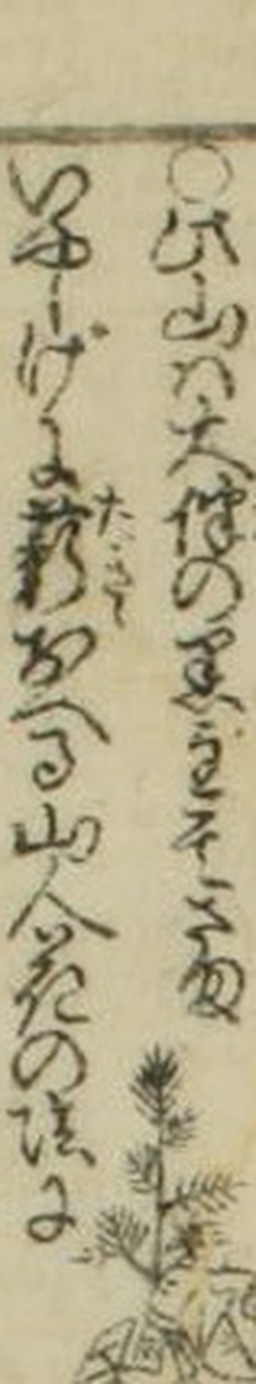いやしげに薪おへる山人花の陰に
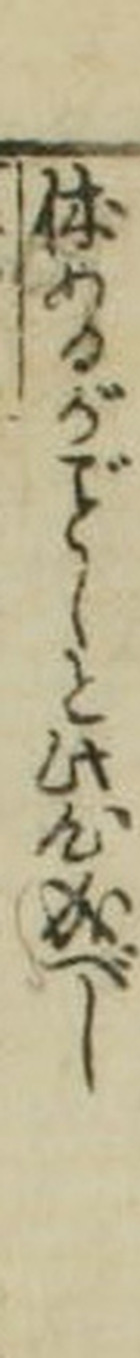休めるがごとしと此心成べし
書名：女源氏教訓鑑
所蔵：東京学芸大学附属図書館
